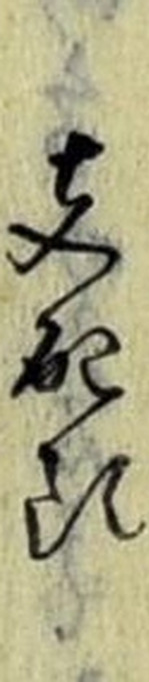支配頭
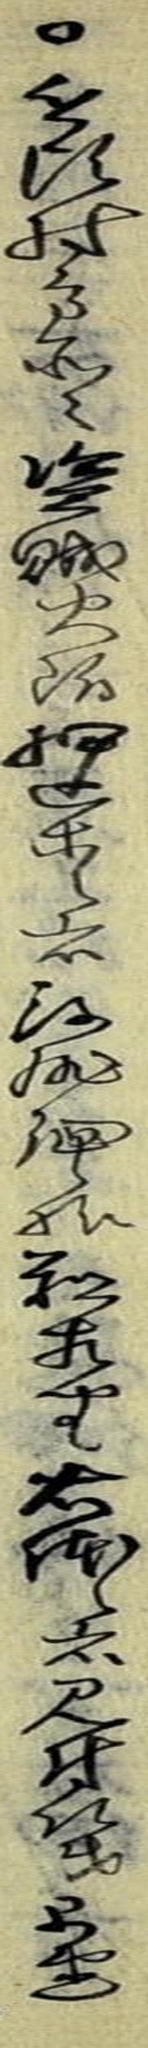〇近頃村方所々盗賊火付押込等之者致徘徊候様粗相聞候右体之者見付次第早速
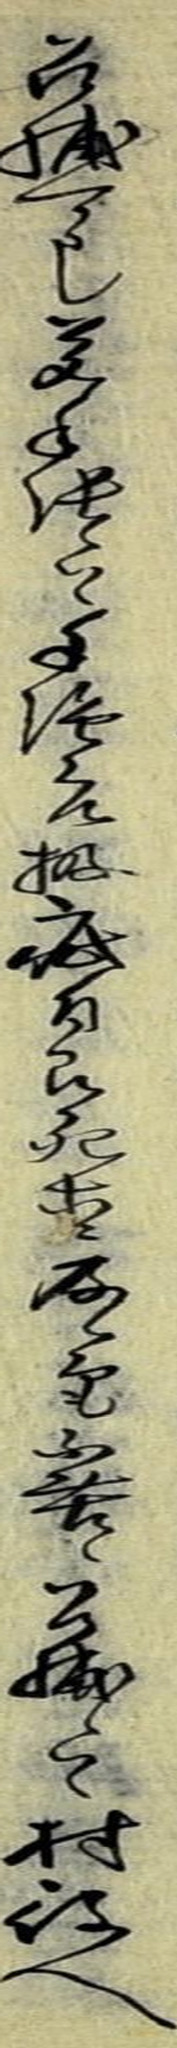召捕可申候若手張候ハヽ手強取扱疵付即死等ニ及候而も不苦候召捕候ハヽ村役人
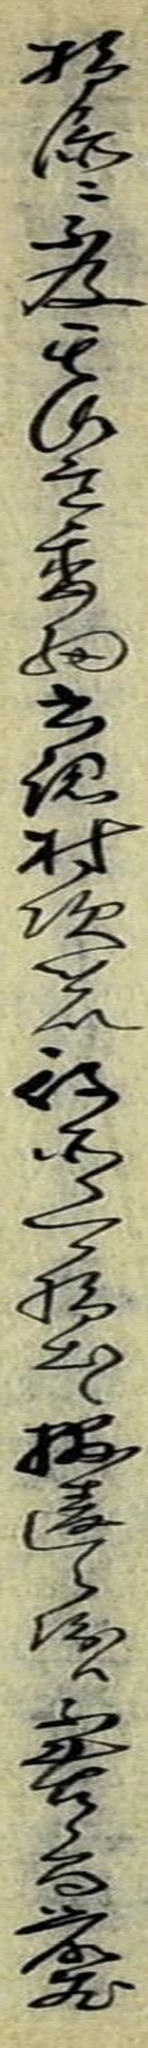指添ニ不及其趣意委細書認村次を以役所へ可指出候捕違之儀ハ不苦候間厳敷
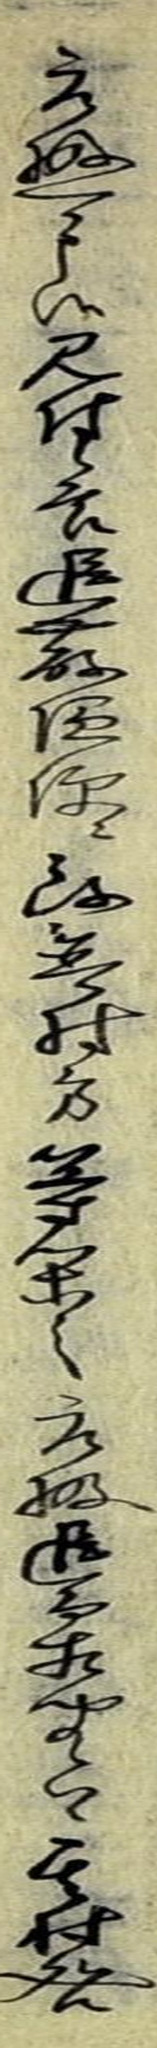取扱可申候見付候節追散温便ニ致置候村方等閑之取扱追而相聞候ハヽ其村咎
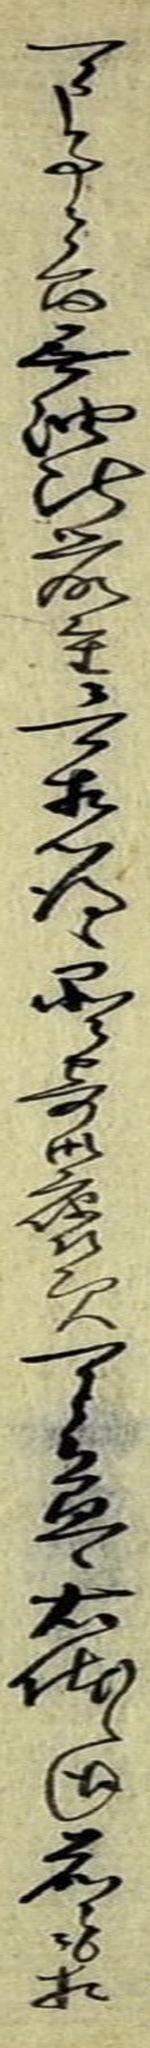可申事ニ候間無油断厳重ニ可相心得候品ニ寄御褒美可被下置候右体之趣前々も相
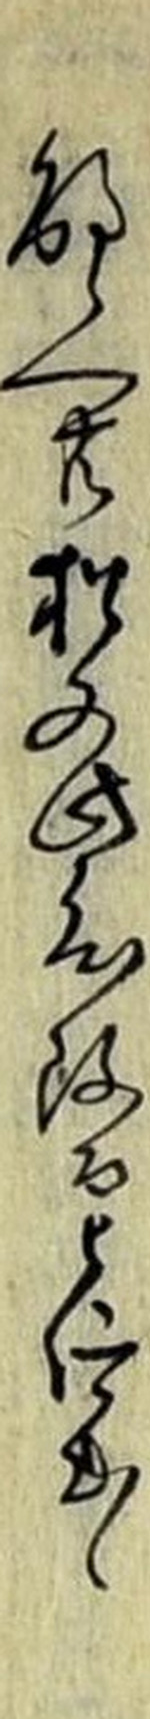触候へ共猶又此度改而被仰出候
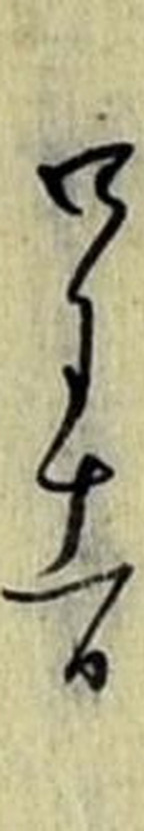四月十一日
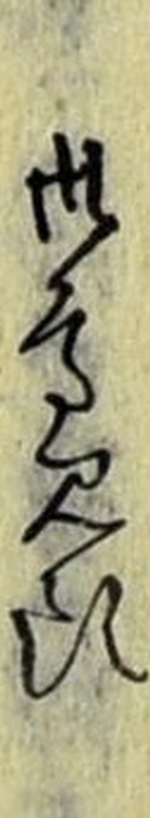御鳥見頭
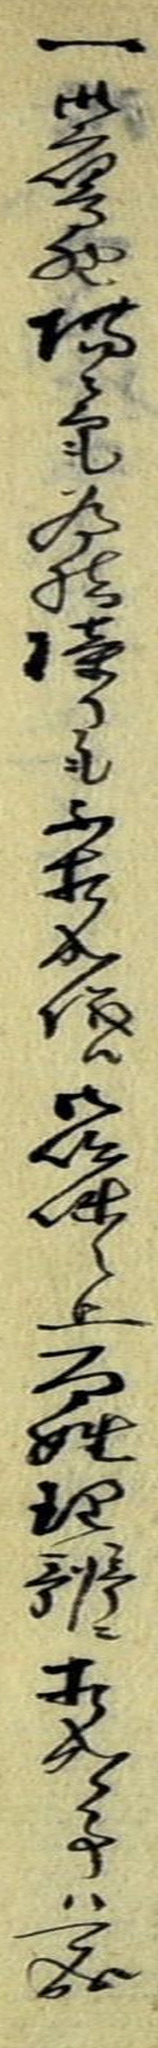一御鷹野場ニ而も為指障りニも不相成儀ハ御吟味之上百姓理弁ニ相成候事ハ可成

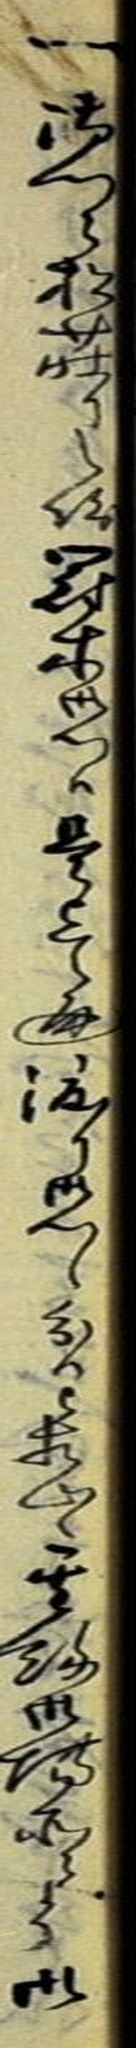一御門之松荘り之儀冠木御門ハ是迄之通渡り御門之分ハ被相止候其余御場所ニより御

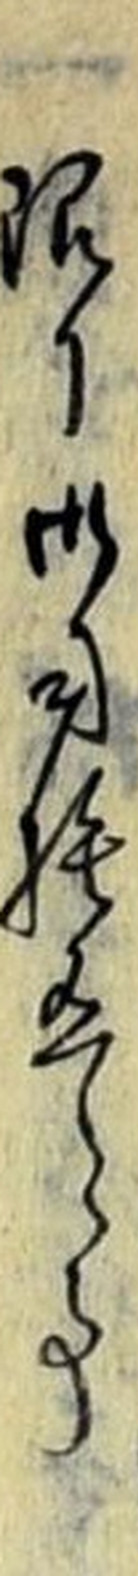限り御用捨有之候事
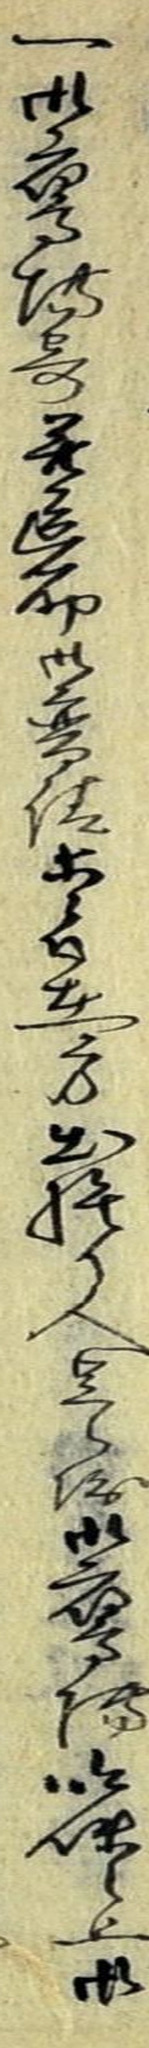一御鷹場寄并道筋御普請等ニ付在方出捨り人足之儀御鷹場吟味之上御
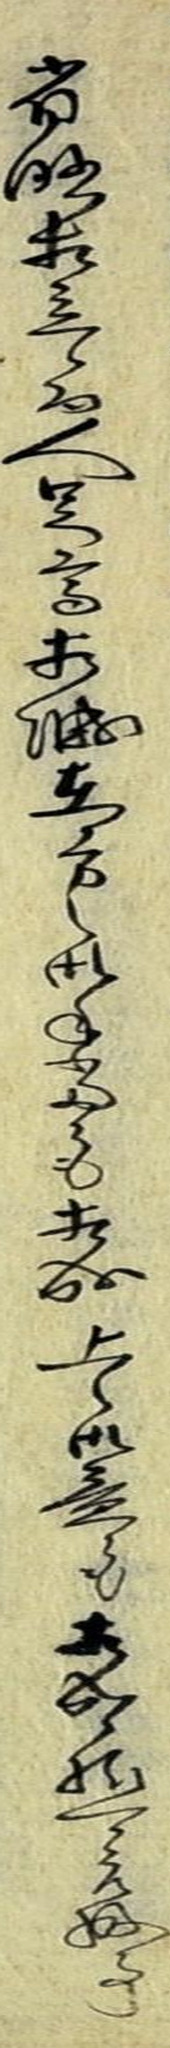省略相立候而人足高相減在方之御手当ニも相成上之御益ニも相成候様可取扱事
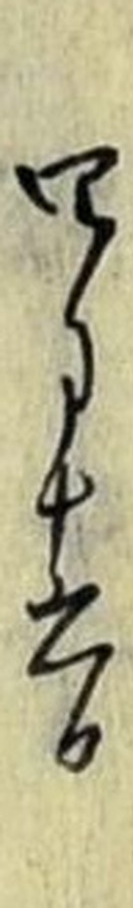四月十六日
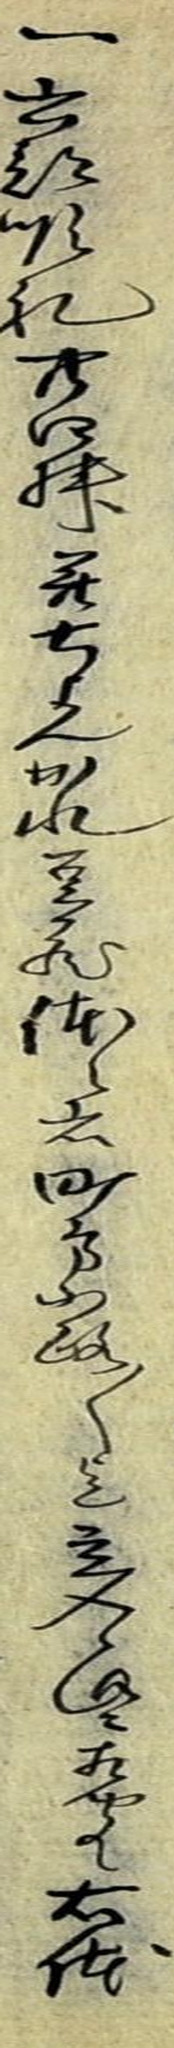一六部巡礼廿四拝并ちよんかれ豆蔵体之者町方小路〳〵迄立入候趣ニ相聞候右体
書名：命令之部 三
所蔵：福井県文書館 Fukui Prefectural Archives
